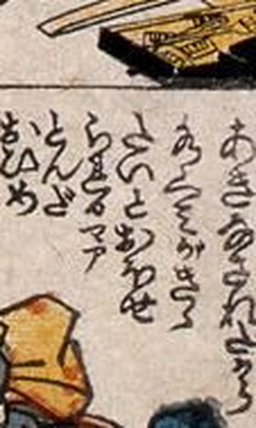たいとおほせ
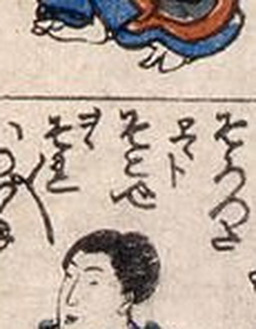そこで
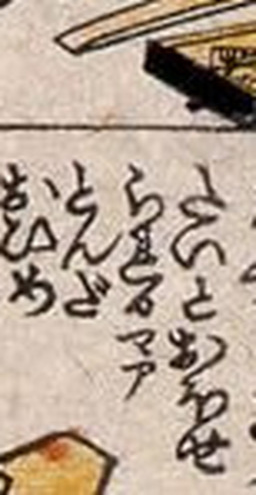おひめ
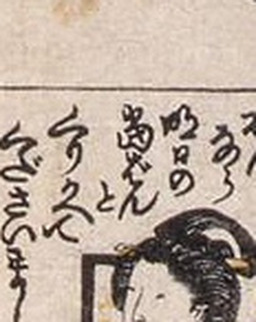当ばんと
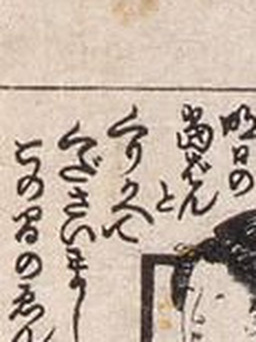くりかへて
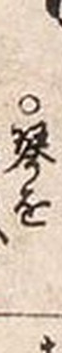○琴を
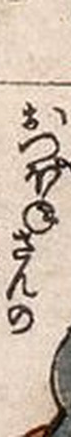おつぼねさんの
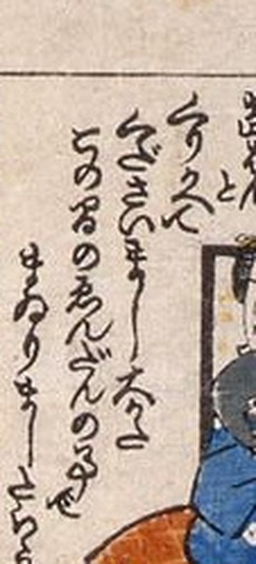くださいまし大かた
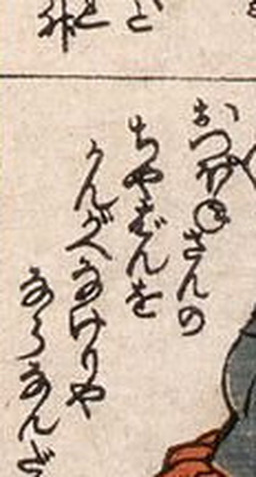ちやばんを
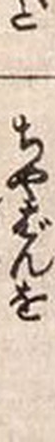ちやばんを
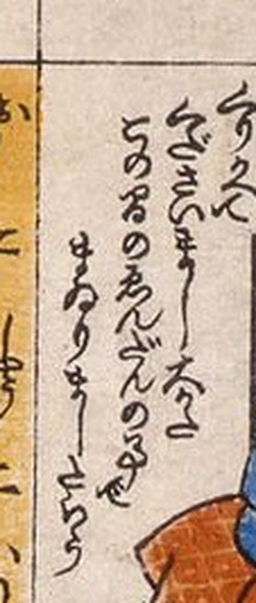この間のゑんだんの事で
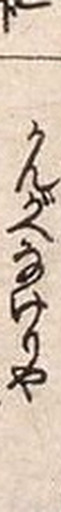かんがへなけりや
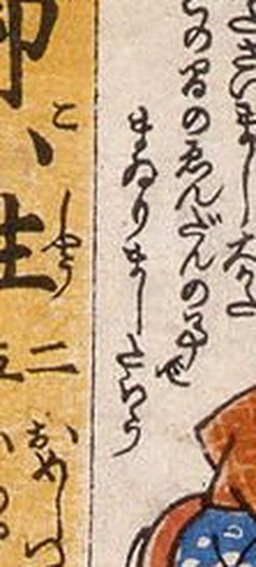まゐりましたらう
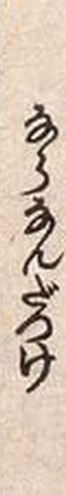ならなんだつけ
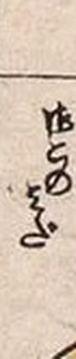御このみだ
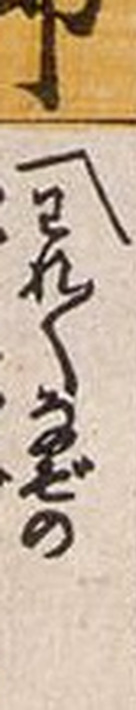〽われ〳〵なぞの
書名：奥奉公出世双六
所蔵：東京学芸大学教育コンテンツアーカイブ
